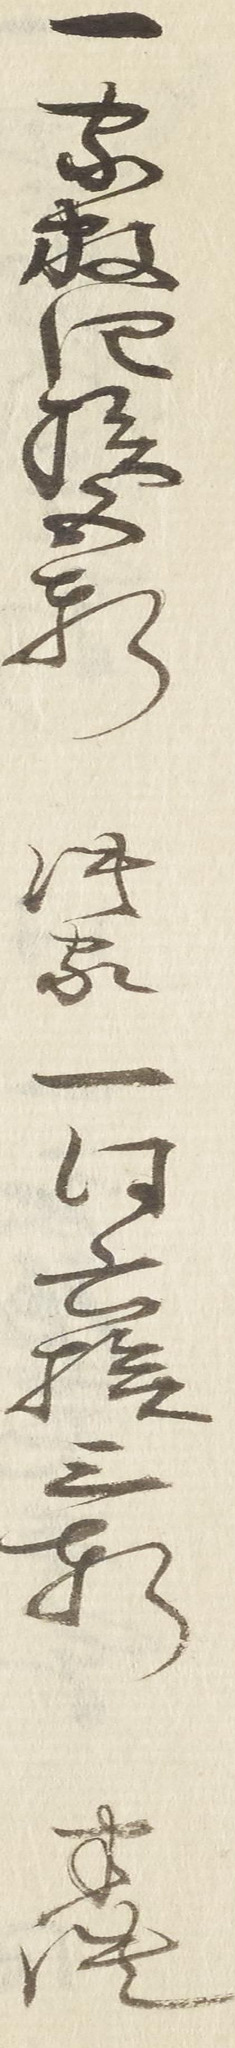一家数四拾五軒潰家一同六拾三軒半潰
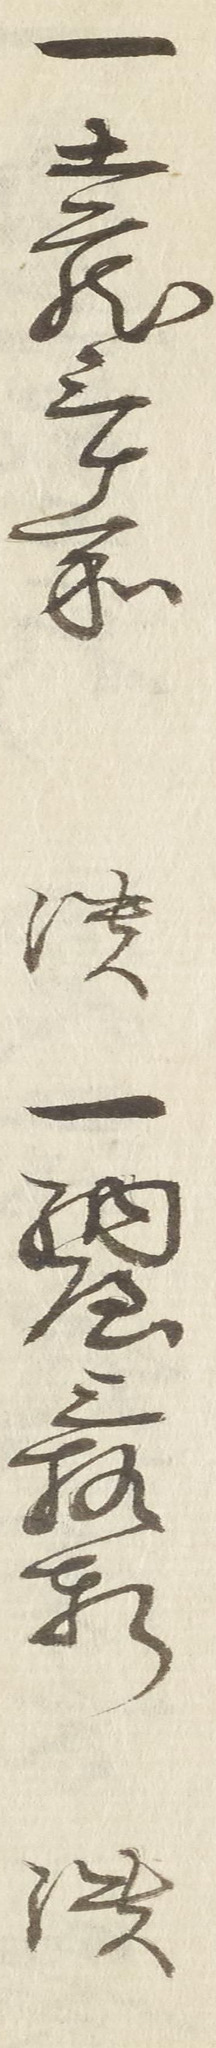一土蔵三ヶ所潰一納屋三拾軒潰
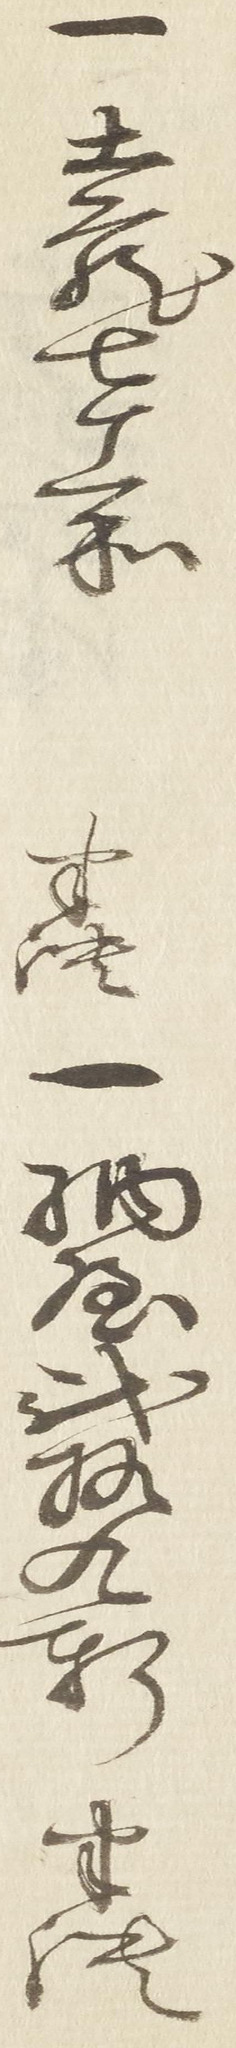一土蔵七ヶ所半潰一納屋弐拾九軒半潰
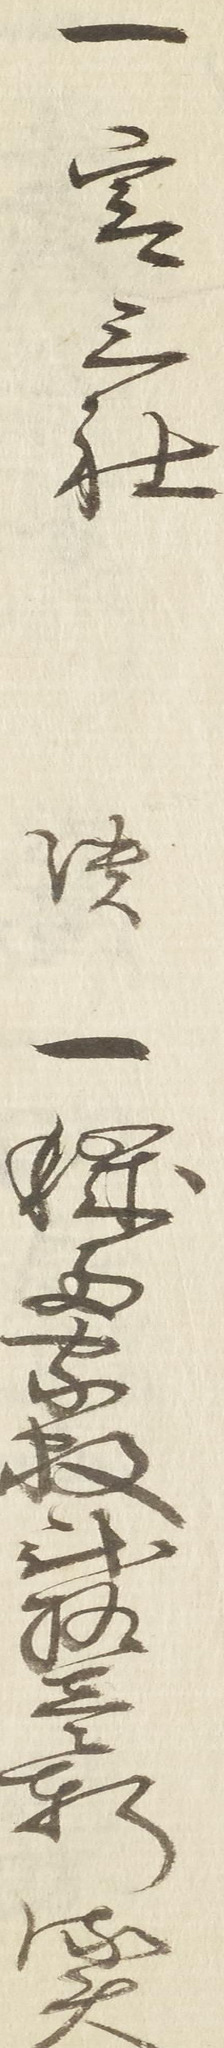一宮三社潰一穢多家数弐拾壱軒流失
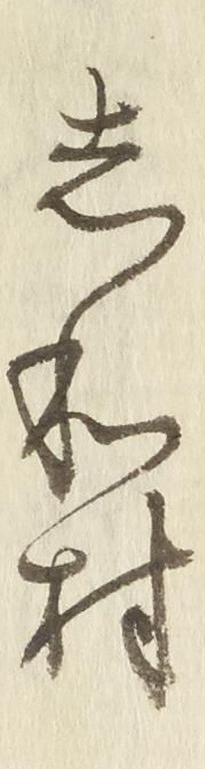志和村
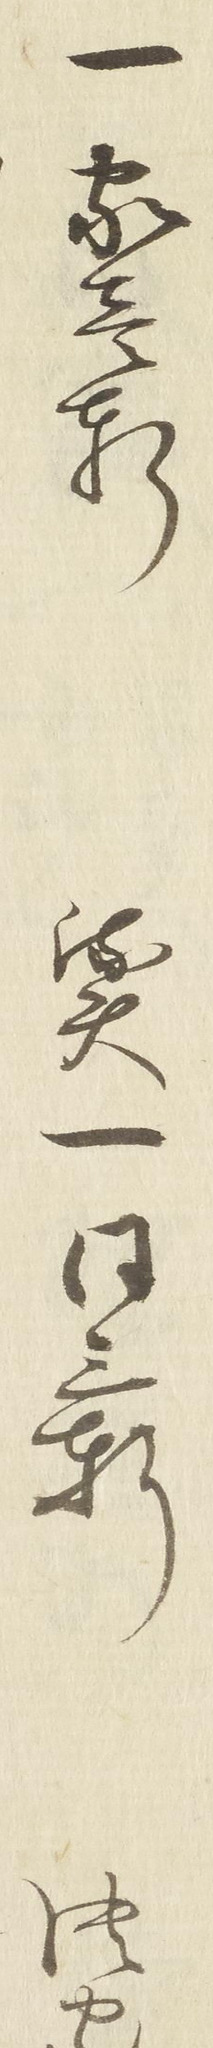一家壱軒流失一同三軒潰家

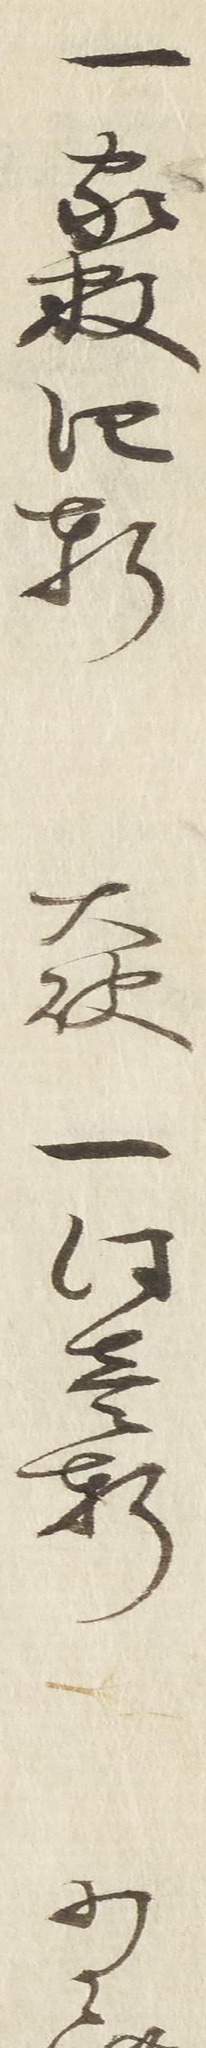一家数四軒大破一同壱軒少々傷
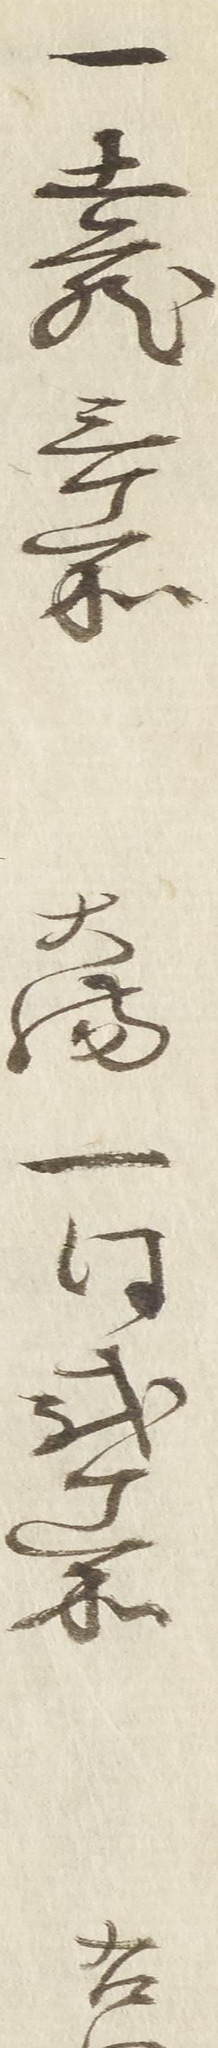一土蔵三ヶ所大傷一同弐ヶ所右同
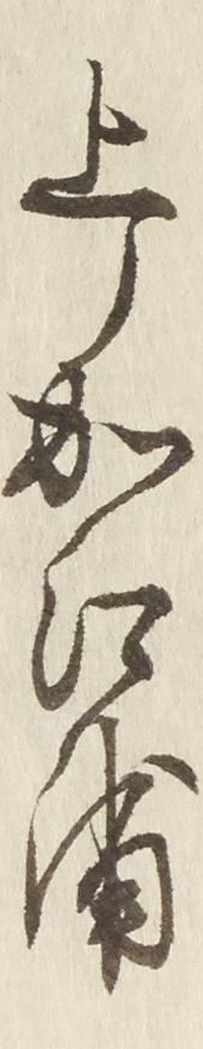上ノ加江浦
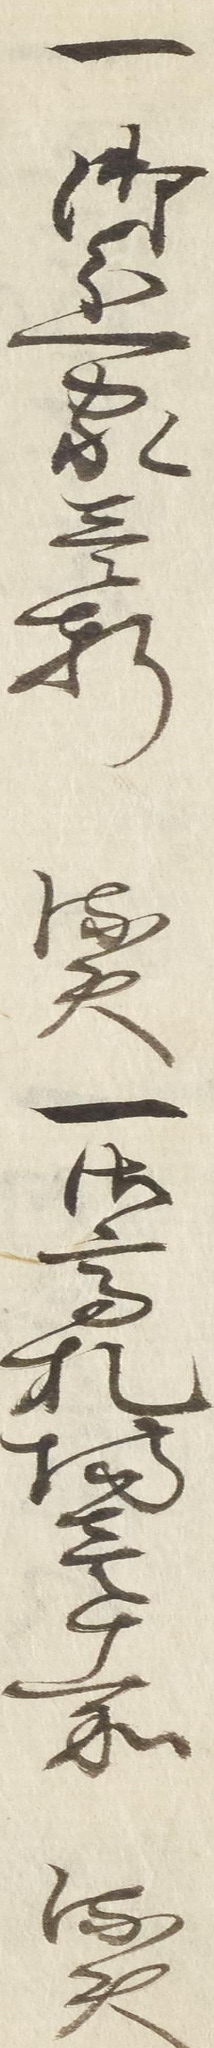一御分一家壱軒流失一御高札場壱ヶ所流失
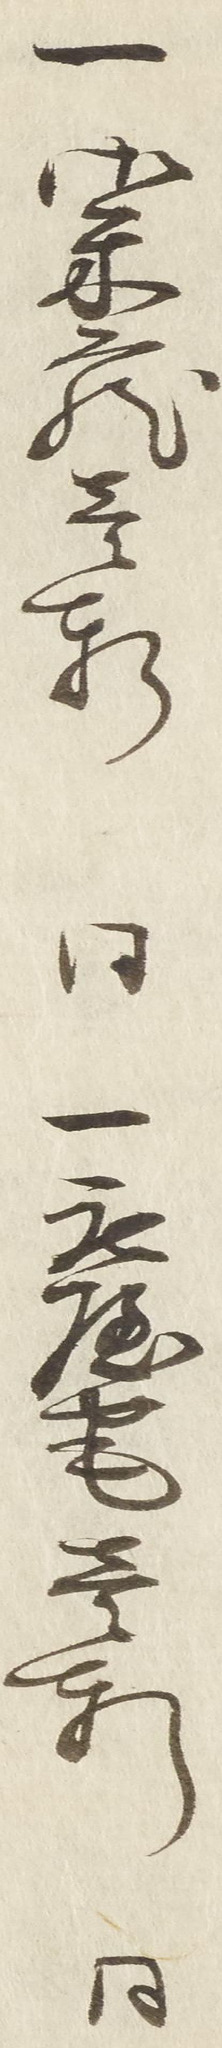一御米蔵壱軒同一庄屋宅壱軒同
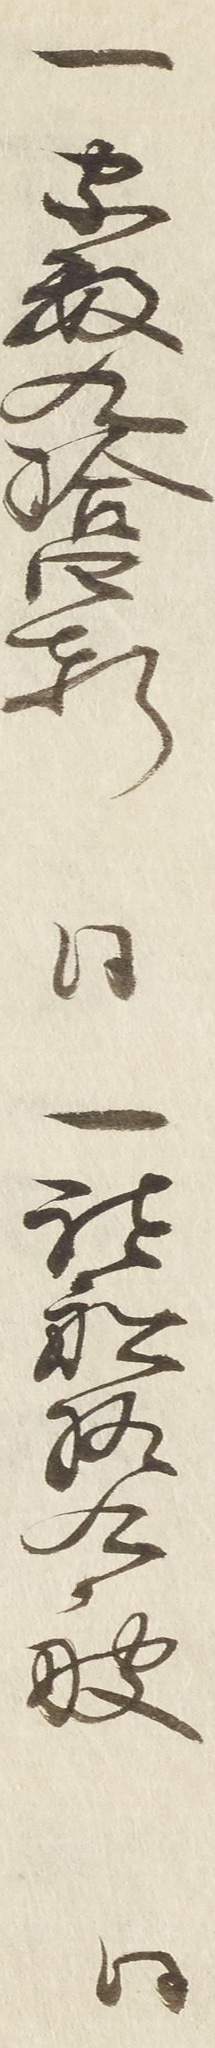一家数九拾四軒同一諸船拾九艘同
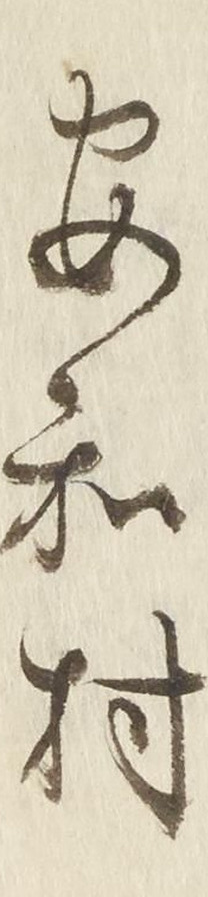安和村
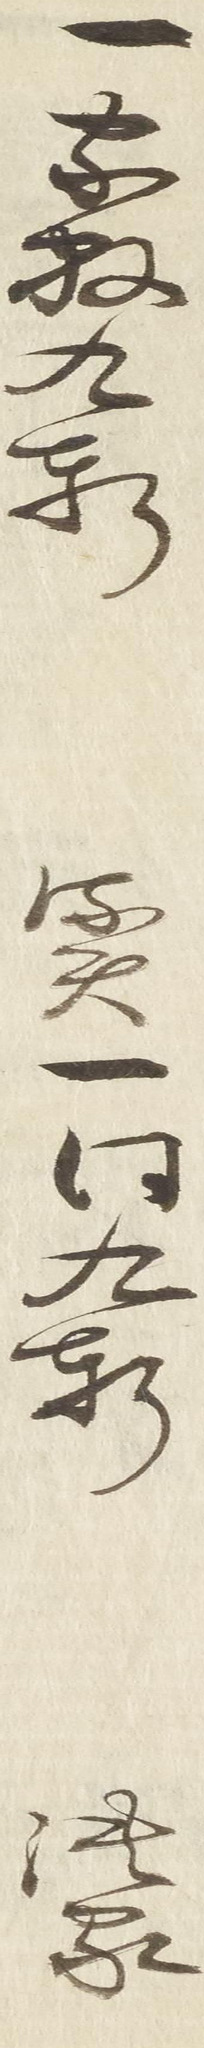一家数九軒流失一同九軒潰家
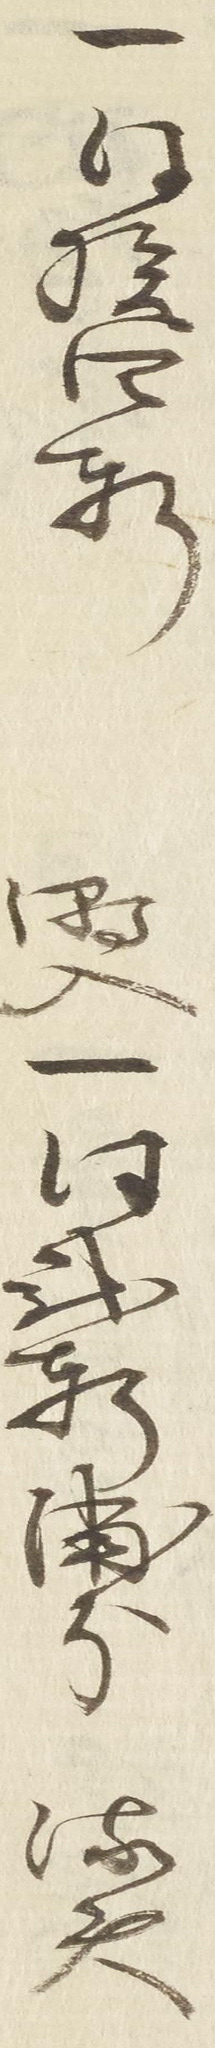一同拾四軒潮入一同弐軒浦分流失
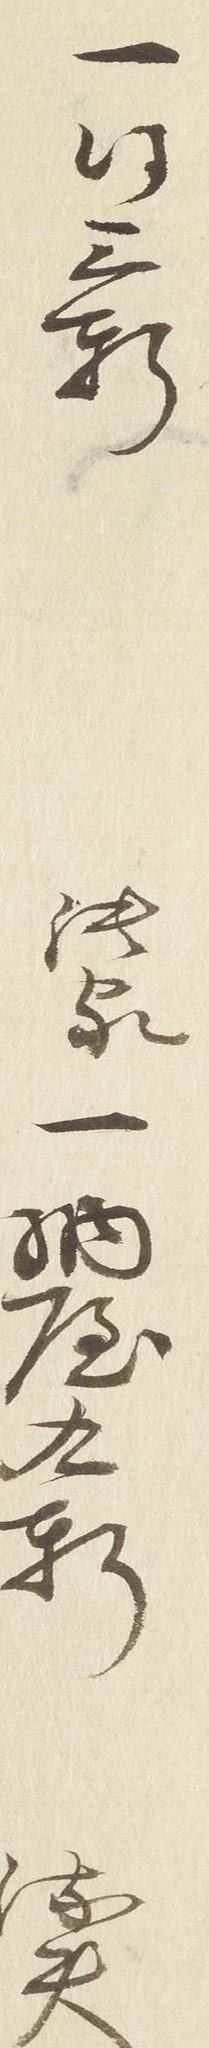一同三軒潰家一納屋九軒流失
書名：地震記　下
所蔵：東京大学地震研究所図書室 Earthquake Research Institute Library, The University of Tokyo, JAPAN
